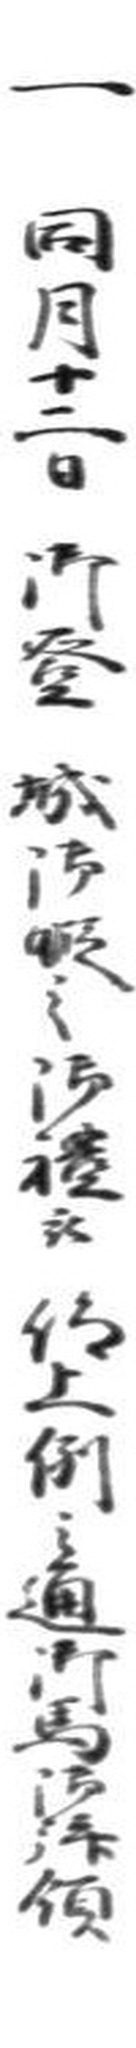一同月十二日御登城御暇之御礼被仰上例之通御馬御拝領
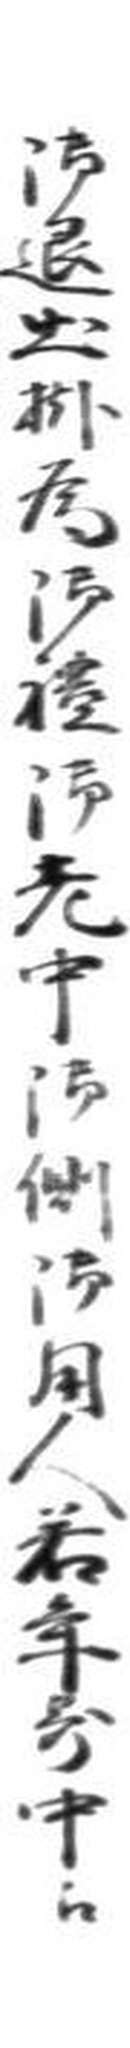御退出掛為御礼御老中御側御用人若年寄中江

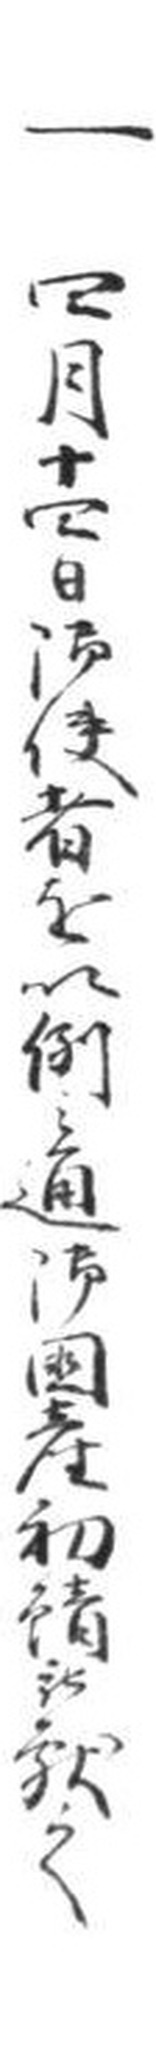一四月十四日御使者を以例之通御国産初鯖被献之
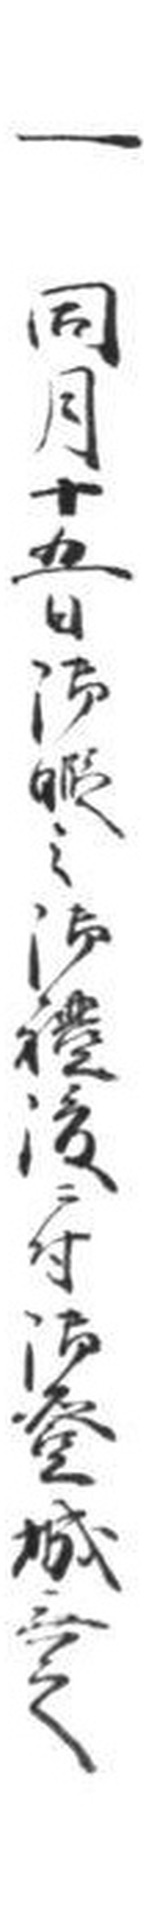一同月十五日御暇之御礼後二付御登城無之
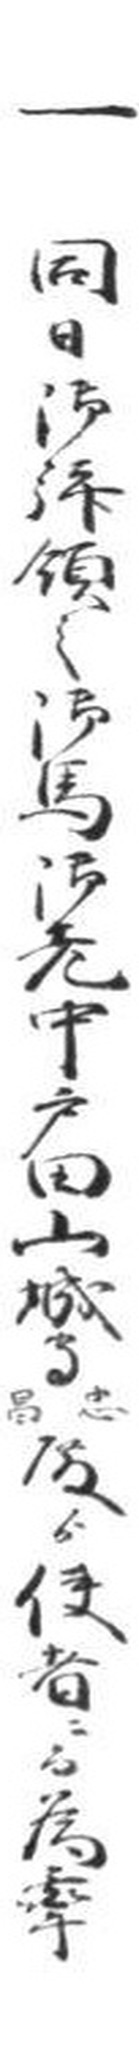一同日御拝領之御馬御老中戸田山城守忠昌殿ゟ使者ニ而為率
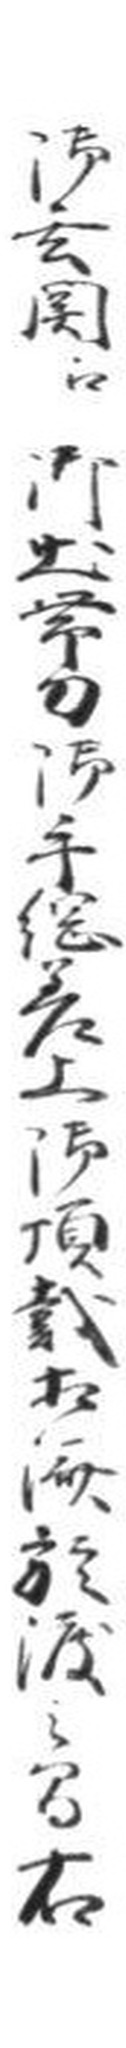御玄関江御出帯刀御手綱差上御頂戴相済於渡之間右
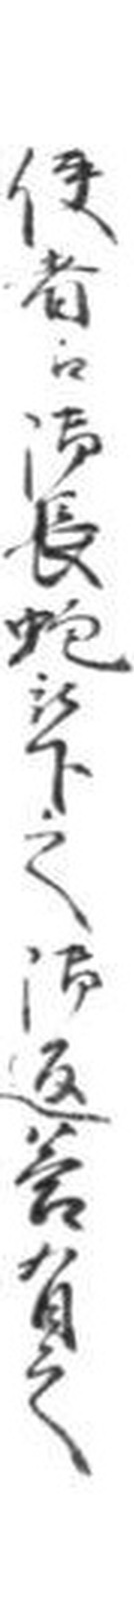使者江御長蚫被下之御返答有之
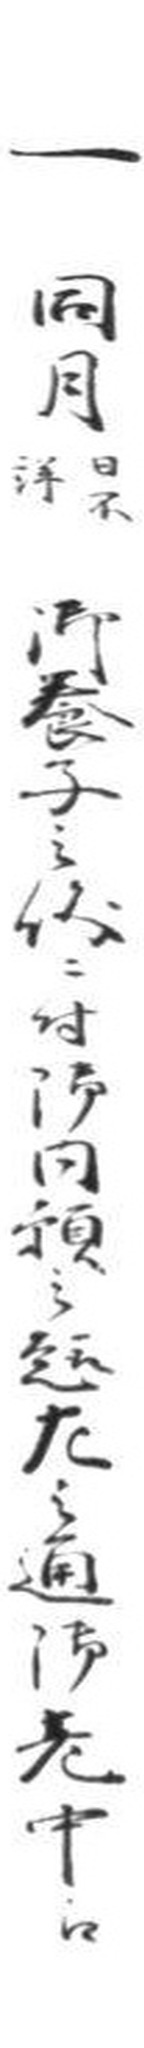一同月日不詳御養子之儀ニ付御同願之趣左之通御老中江
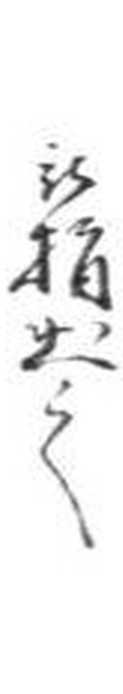被指出之
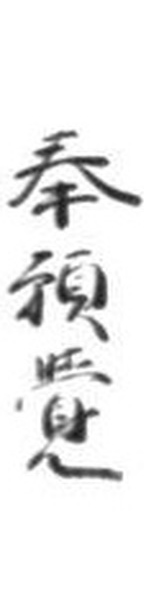奉願覚
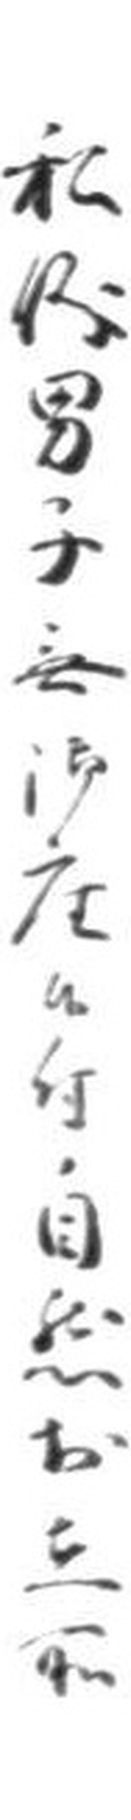私儀男子無御座候候付自然於在所
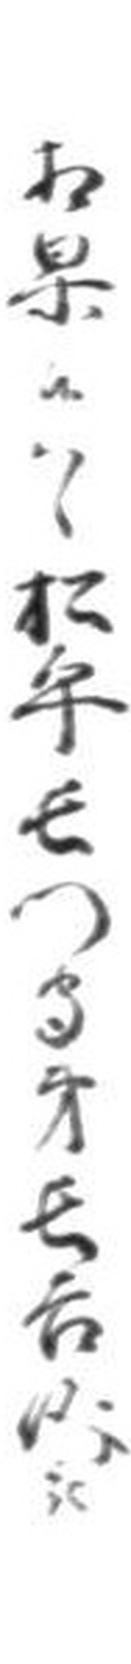相果候ハヽ松平長門守弟長吉儀被
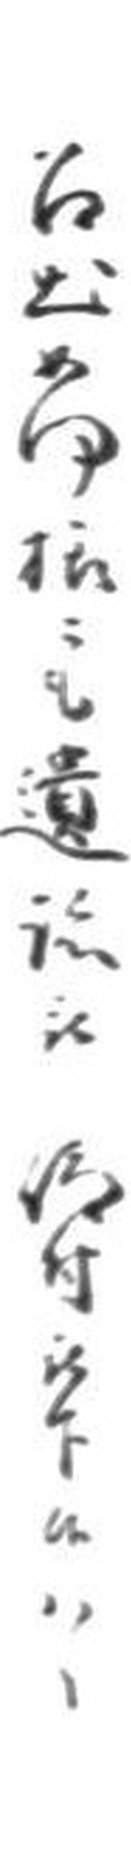召出如何様ニも遺跡被仰付被下候ハヽ
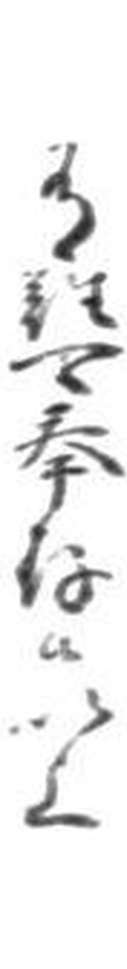有難可奉存候以上
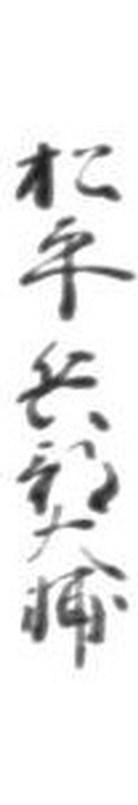松平兵部大輔
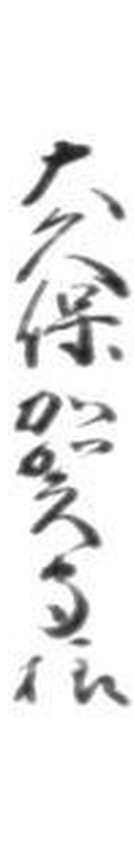大久保加賀守様
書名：家譜 十七 吉品公 従元禄元年到同二年
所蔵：福井県文書館 Fukui Prefectural Archives
